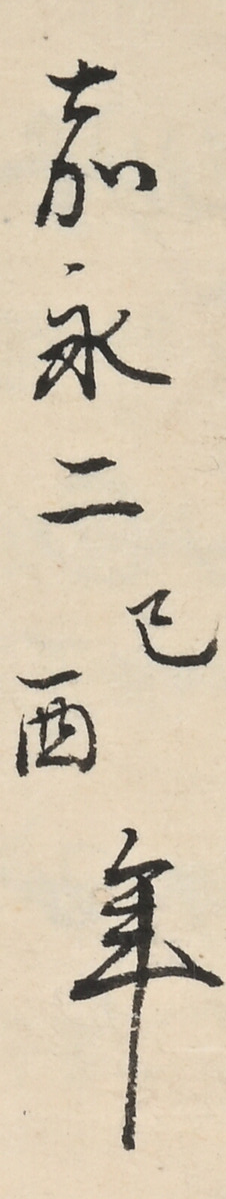嘉永二己酉年
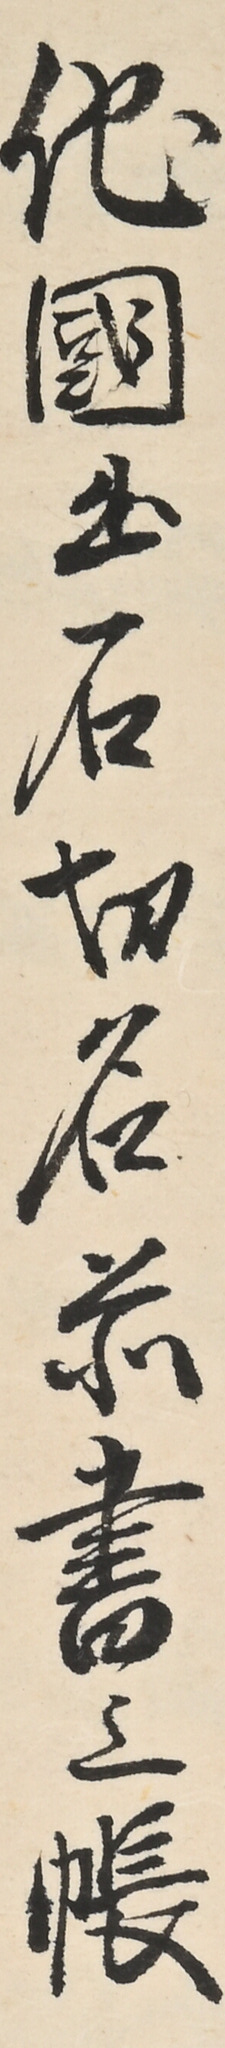他国出石切名前書上帳
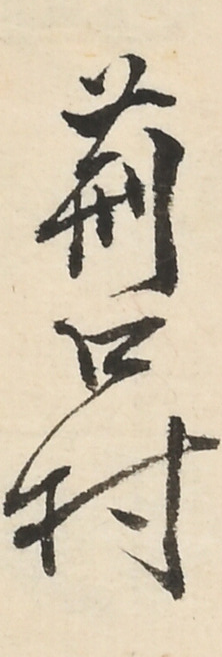荊口村

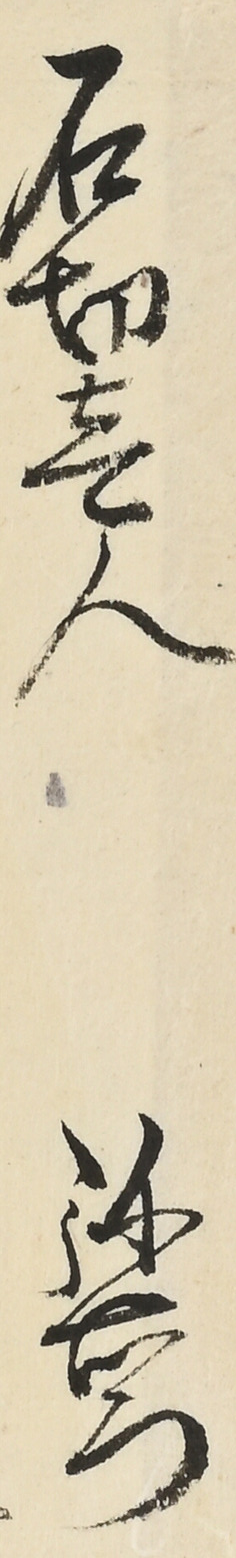石切壱人弥右衛門
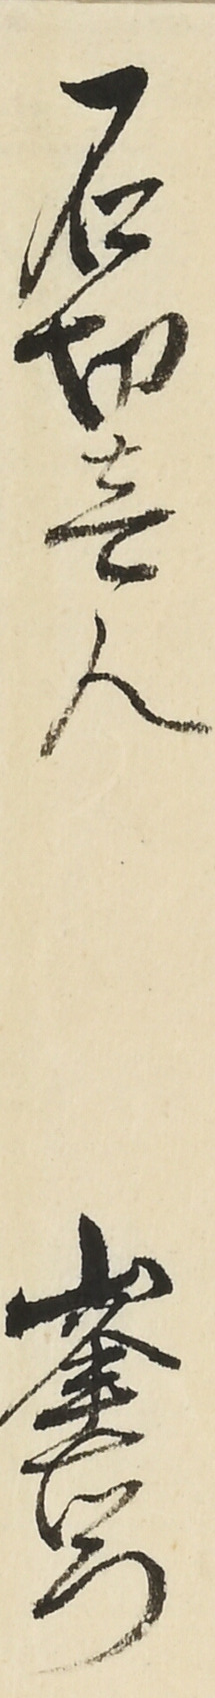石切壱人峯右衛門
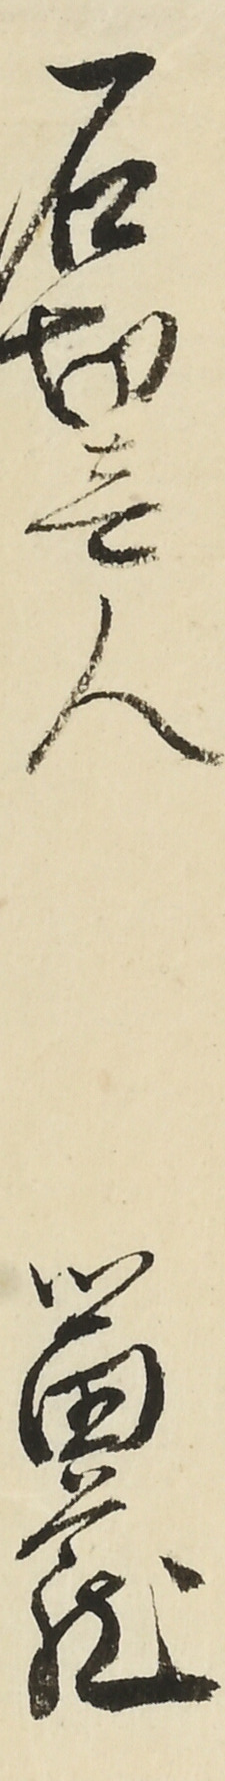石切壱人留蔵
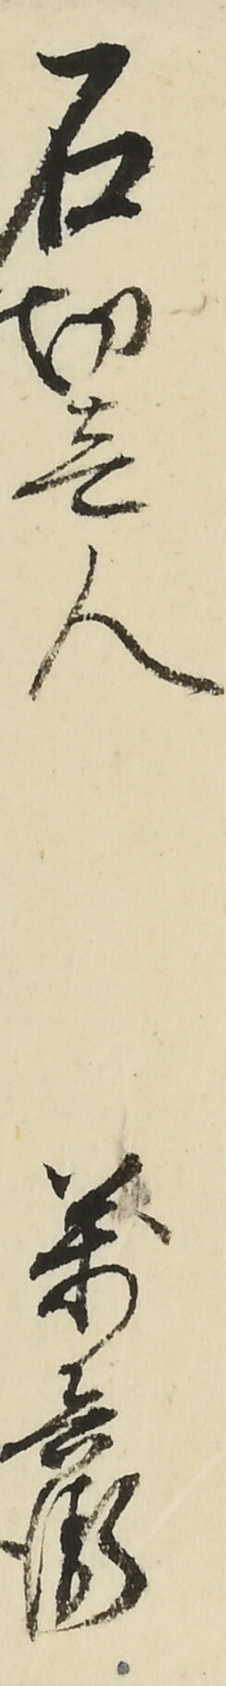石切壱人万兵衛

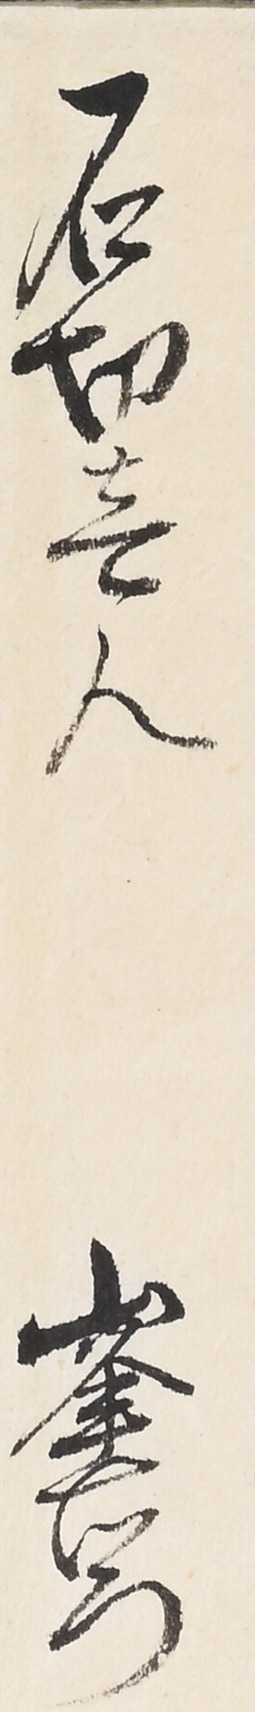石切壱人峯右衛門
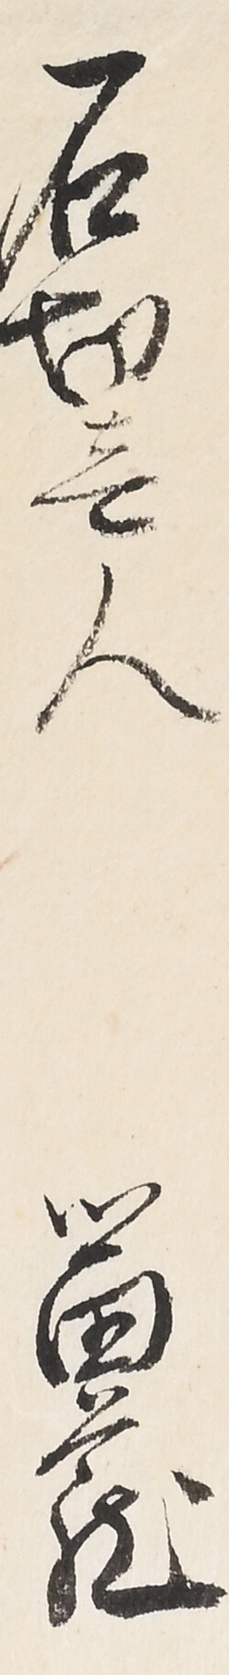石切壱人留蔵
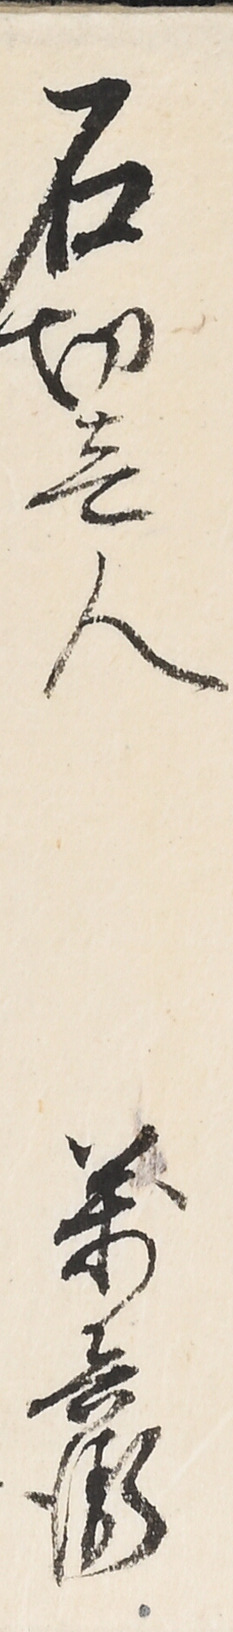石切壱人万兵衛
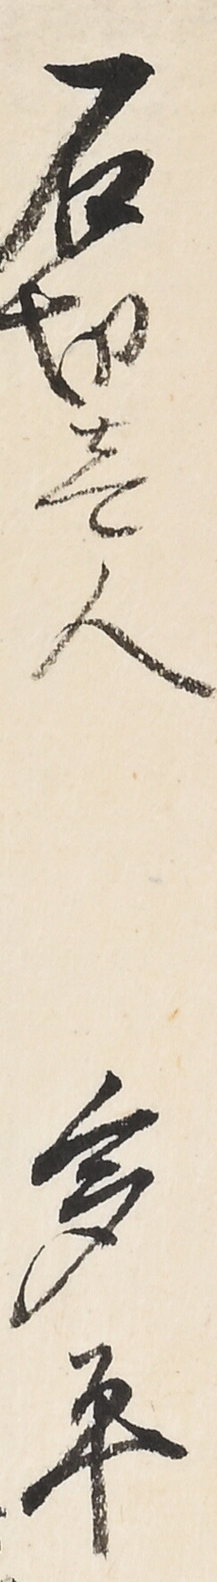石切壱人多平
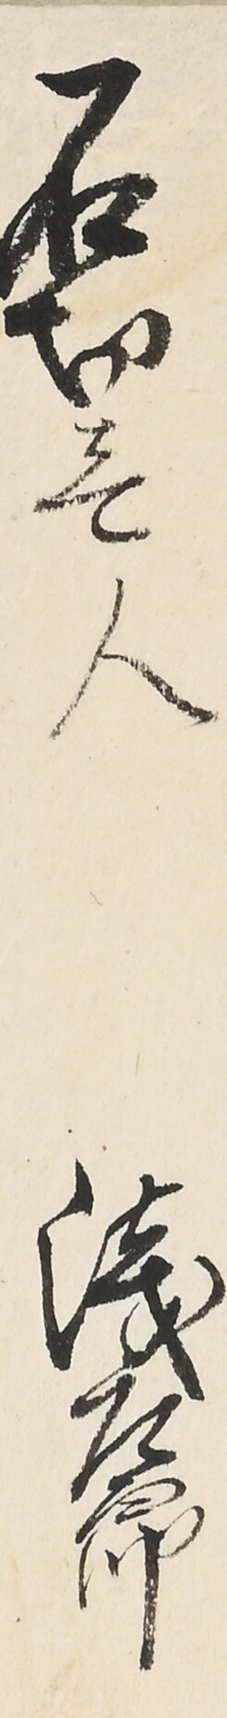石切壱人七左衛門
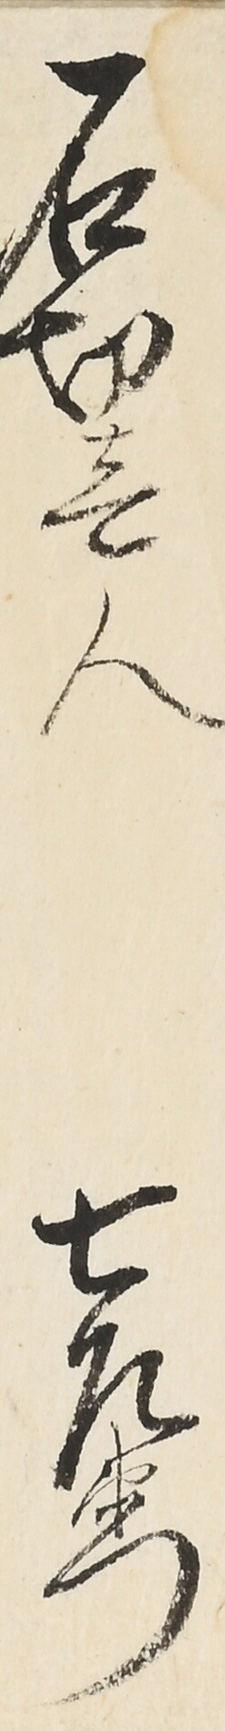石切壱人七左衛門
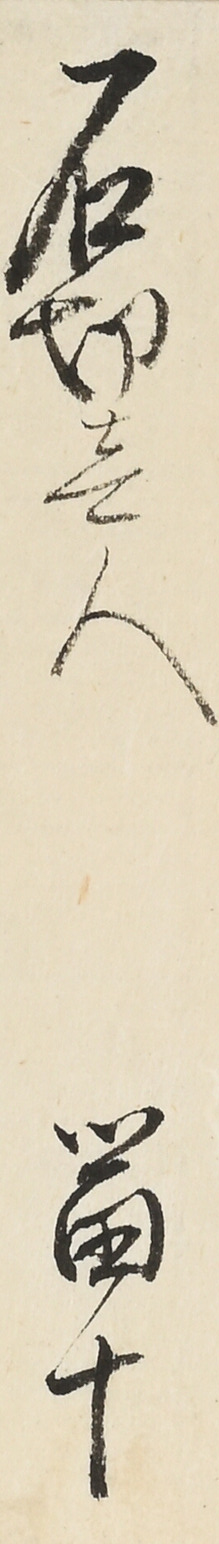石切壱人留十

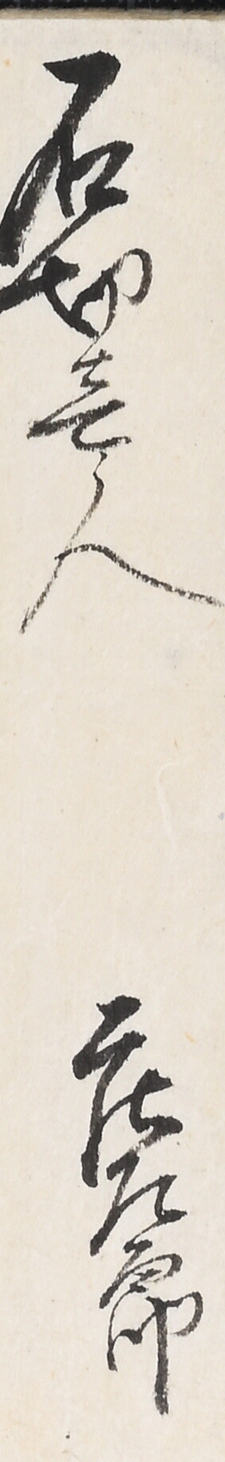石切壱人作右衛門
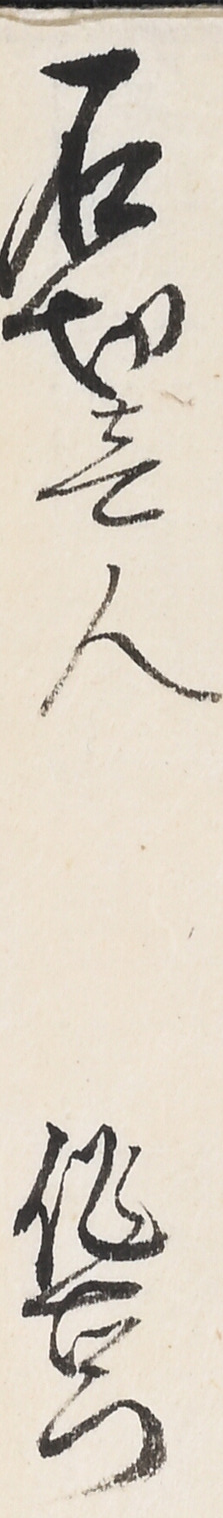石切壱人作右衛門
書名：嘉永二巳酉年二月他國出石切名前書上帳
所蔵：伊那市立高遠町図書館・合同会社AMANE
